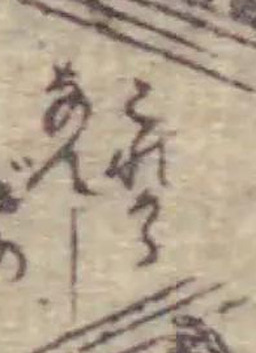これから
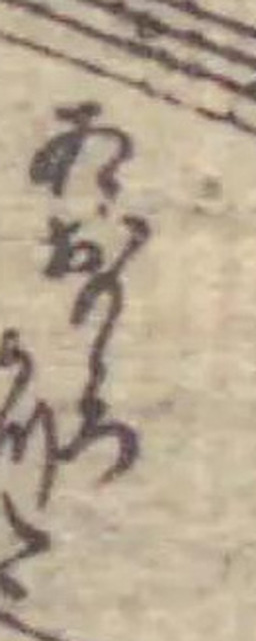あゝおもしろ
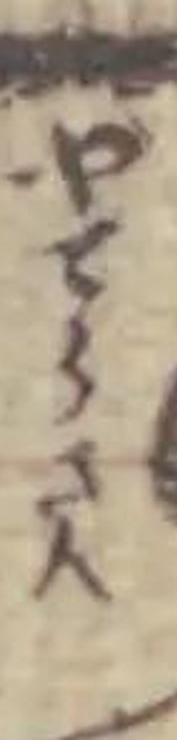やてうさん
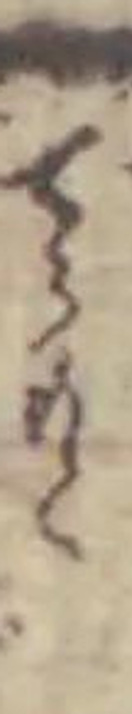てうもと
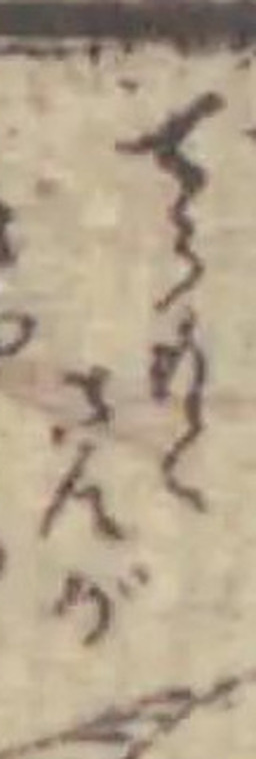さんが
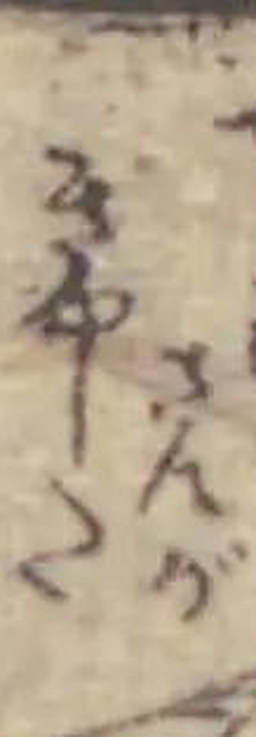きやした
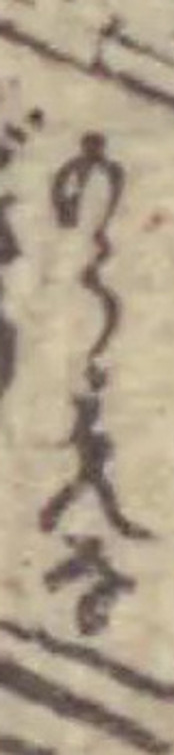もうみんな
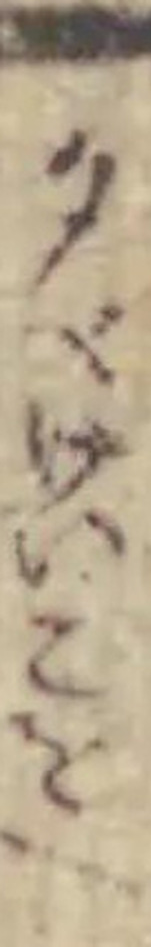夕べけいこを
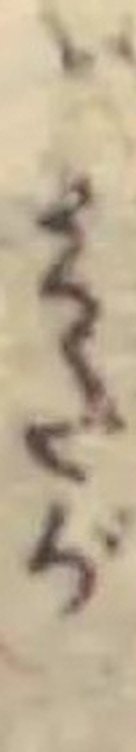みたが
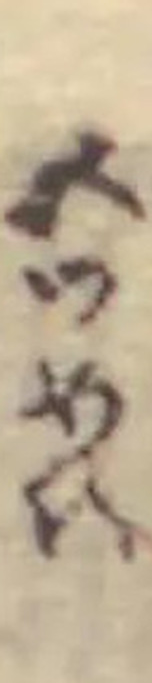五つめは
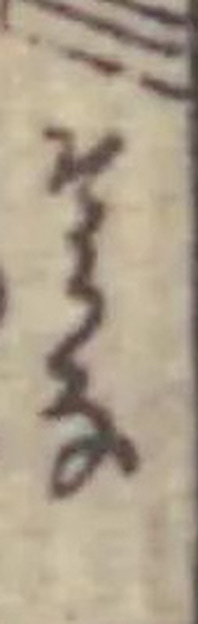そうな
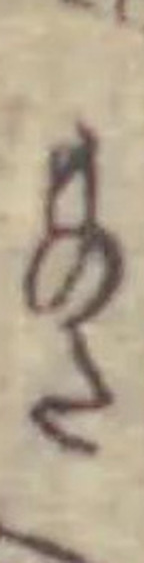ものだ
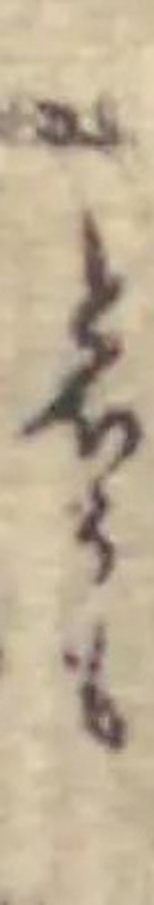とほうも
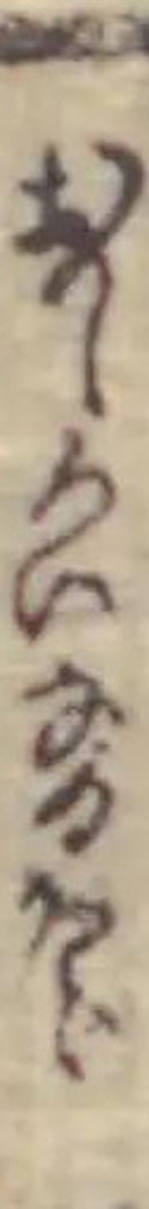おもしろいなるほど
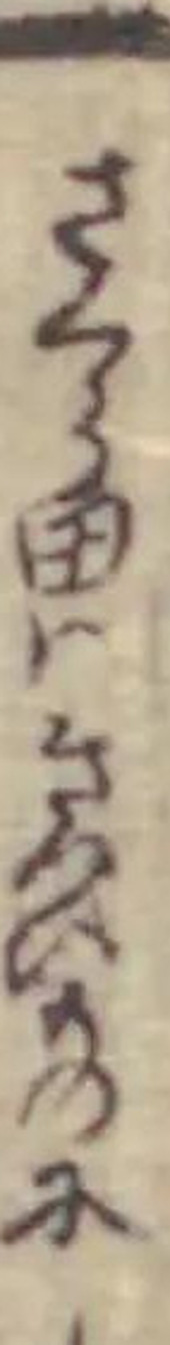さくら田はきわいものに
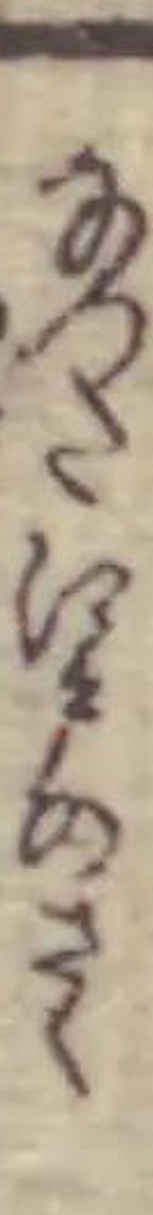なつた江戸のさく
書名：夜野中狐物 2巻
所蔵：国立国会図書館 National Diet Library, JAPAN
